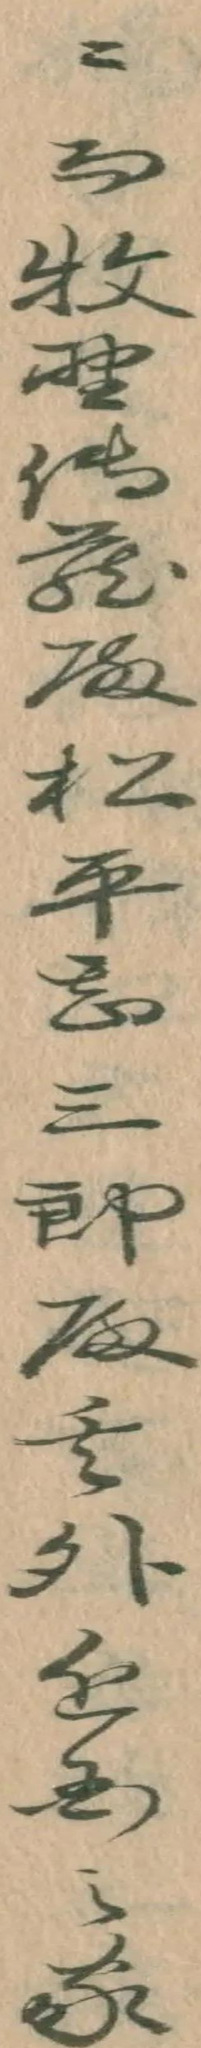に而牧野伝蔵殿松平甚三郎殿其外近国之家
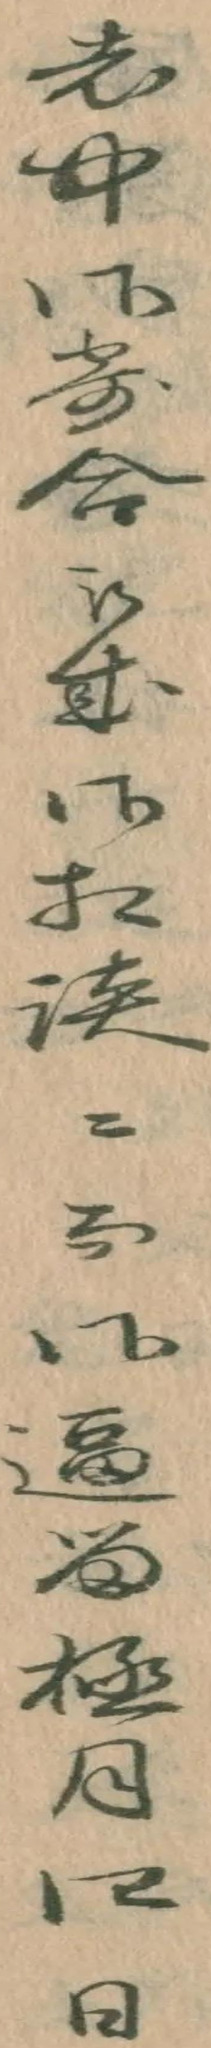老中御寄合被成御相談に而御逗留極月四日
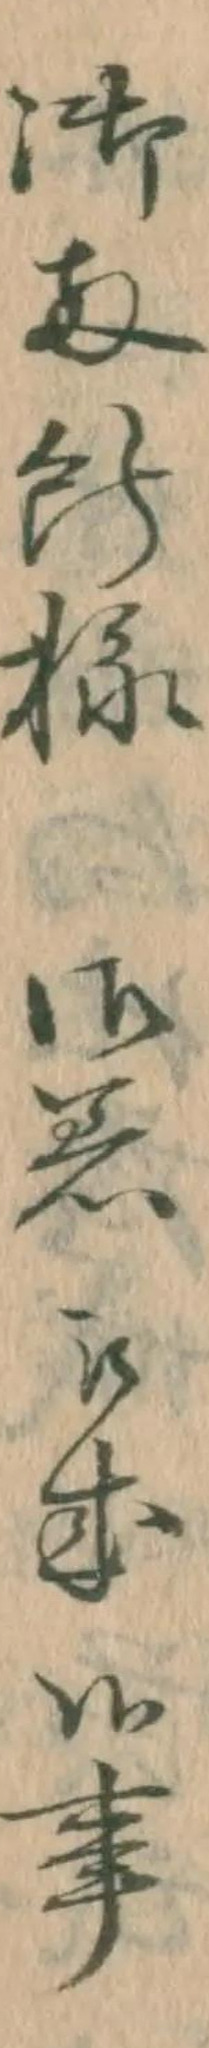御両所様御着被成候事
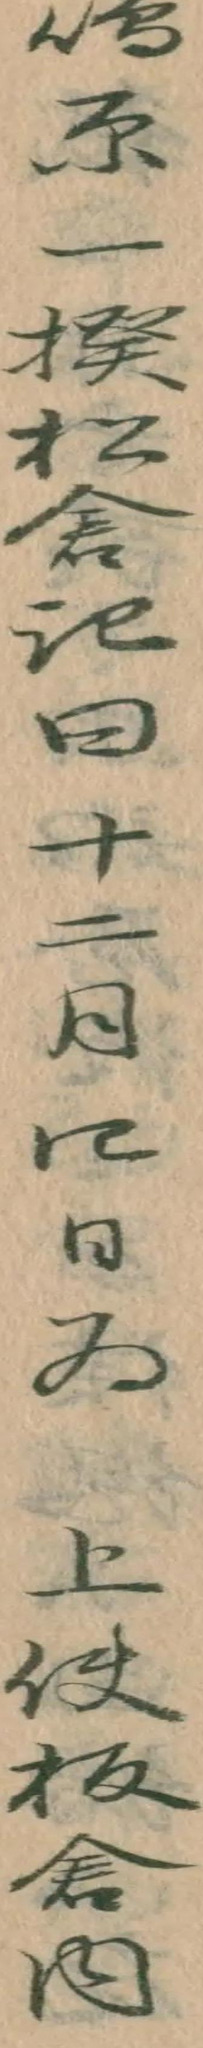島原一揆松倉記曰十二月四日為上使板倉内
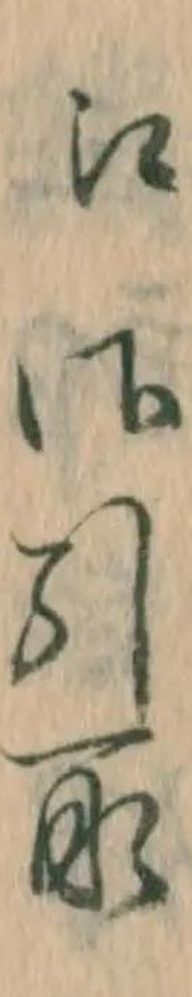江御引取
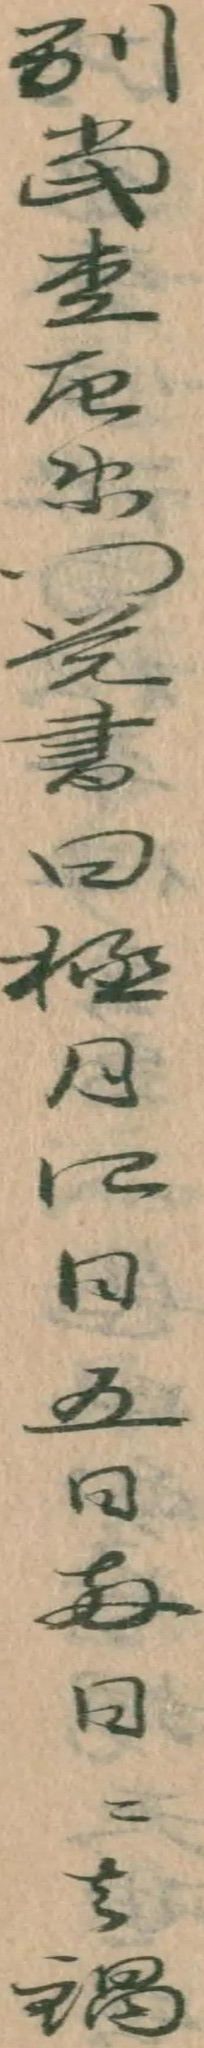別当杢左衛門覚書曰極月四日五日両日には鍋
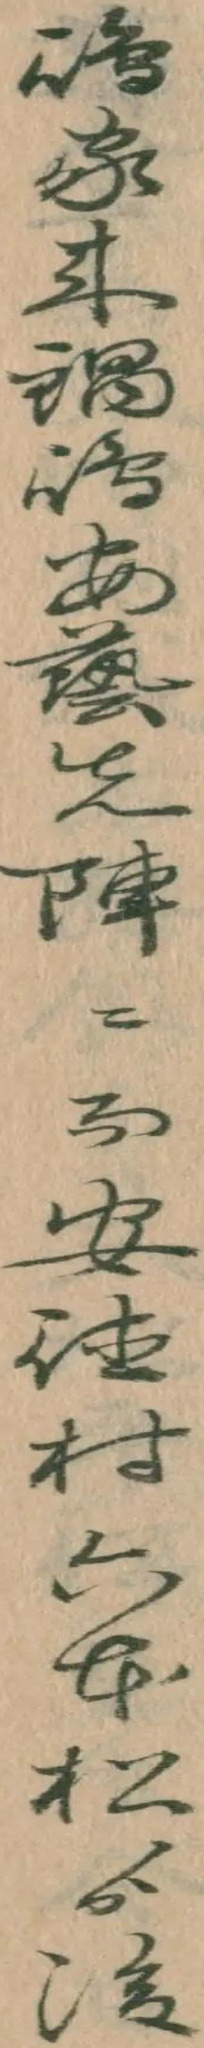島家来鍋島安芸先陣に而安徳村六本松ゟ後
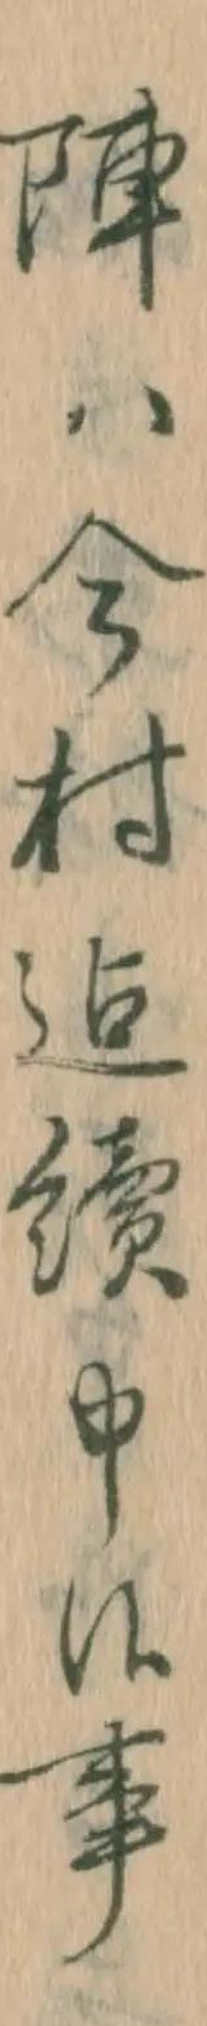陣は今村迄続申候事
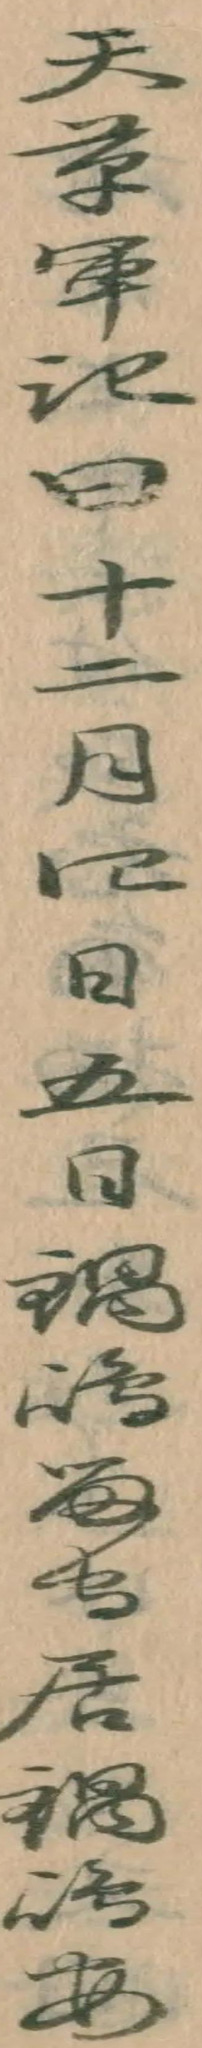天草軍記曰十二月四日五日鍋島留守居鍋島安
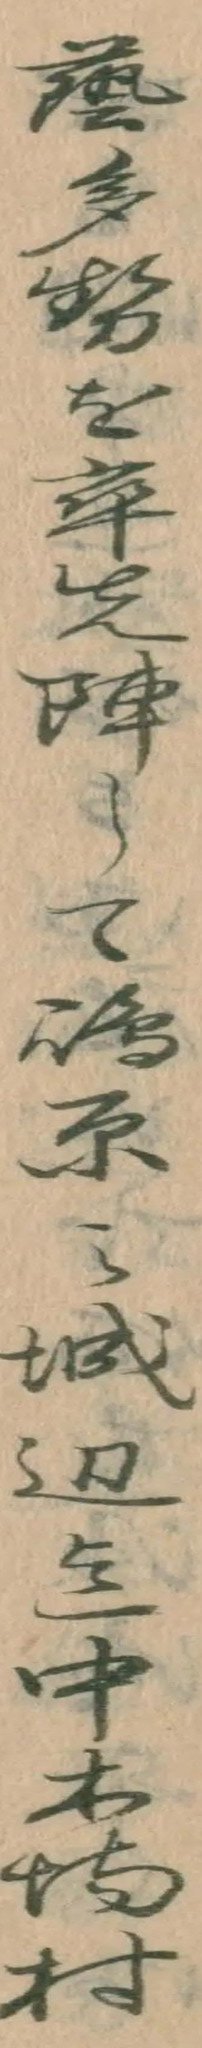芸多勢を卒先陣して島原之城辺迄中木場村
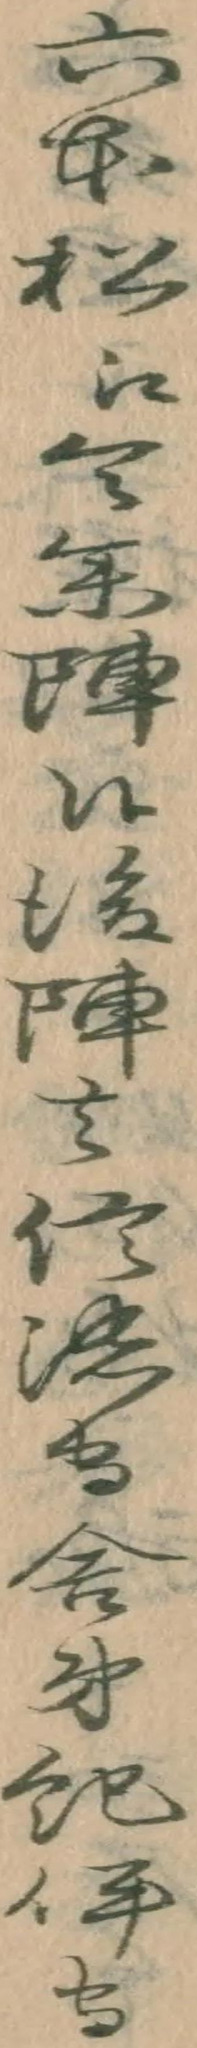六本松江令参陣候後陣は信濃守舎弟紀伊守
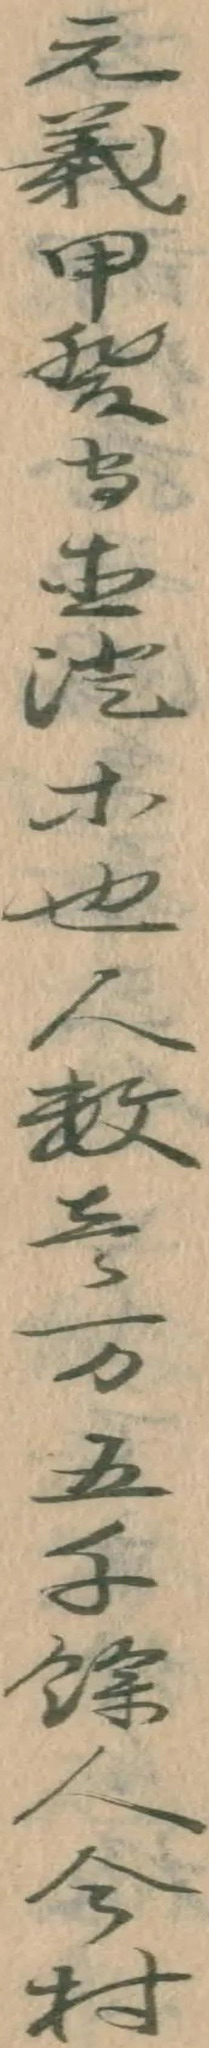元義甲斐守直澄等也人数壱万五千余人今村
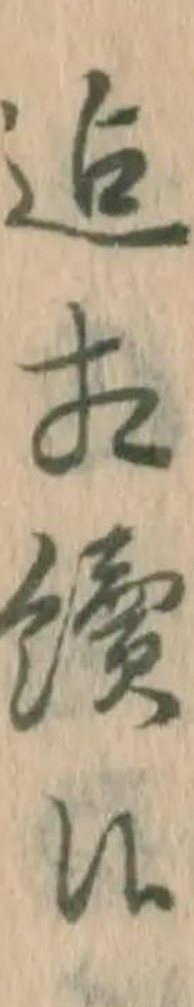迄相続候
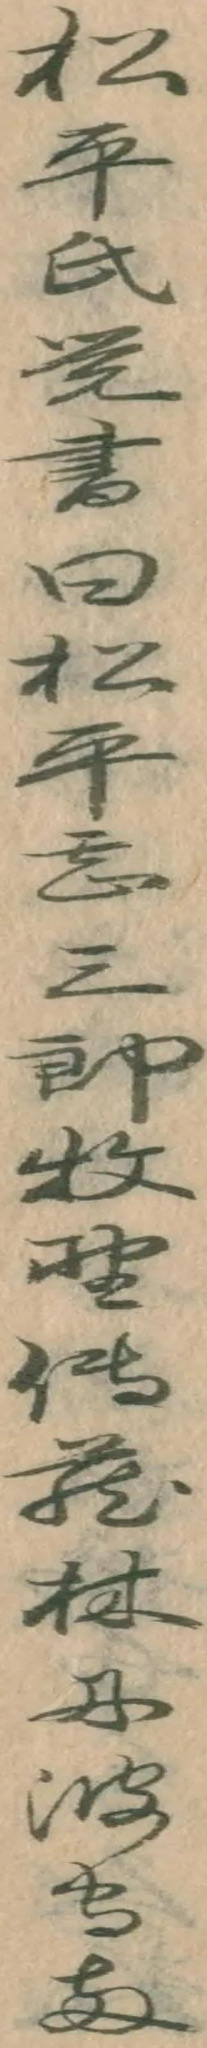松平氏覚書曰松平甚三郎牧野伝蔵林丹波守両
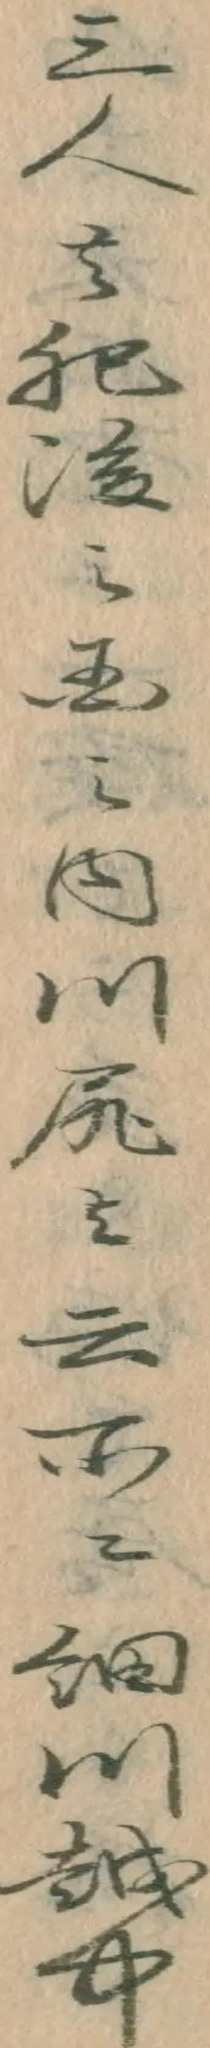三人は肥後之国之内川尻と云所に細川越中
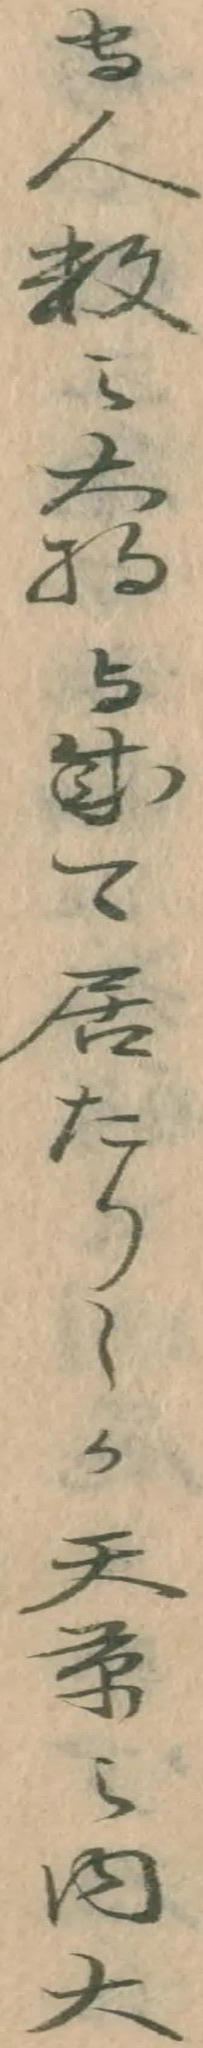守人数之大将と成て居たりしか天草之内大
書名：切支丹御退治記 49巻. [3]
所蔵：国立国会図書館 National Diet Library, JAPAN
